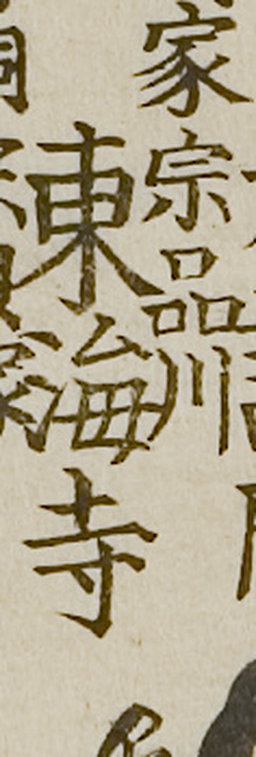東海寺
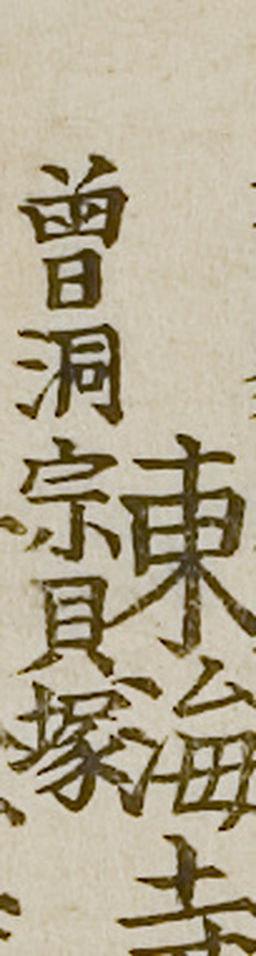曽洞宗貝塚
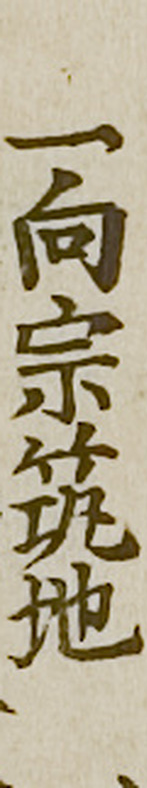一向宗筑地
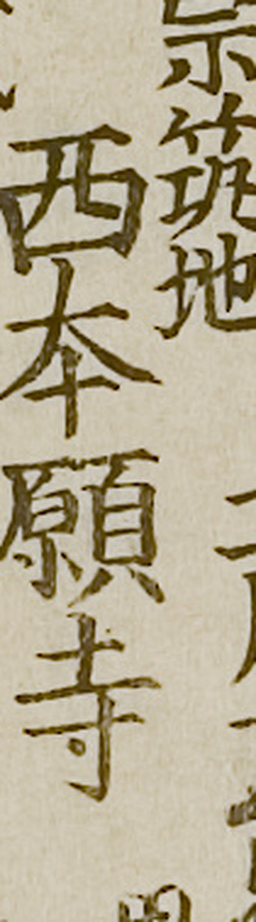西本願寺
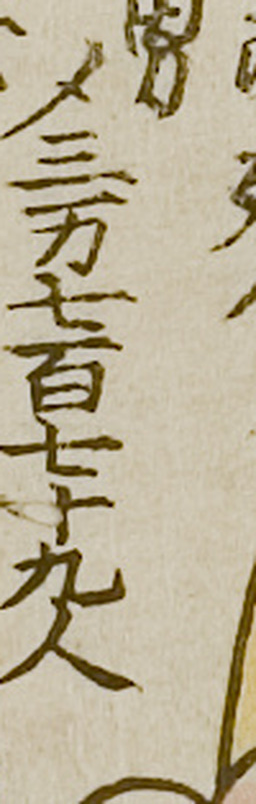〆三万七百七十九人
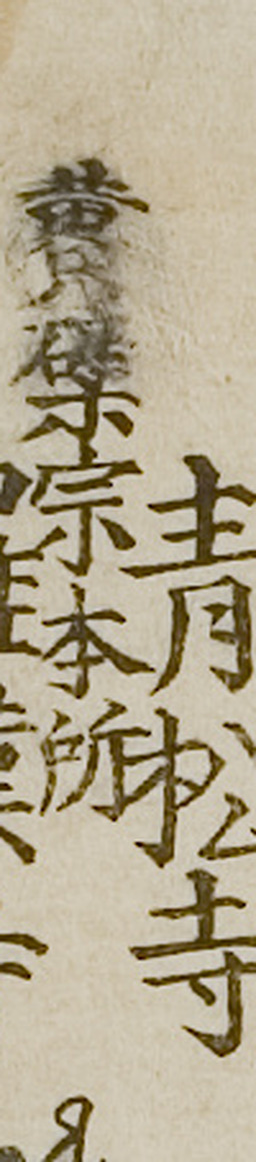黄檗宗本所
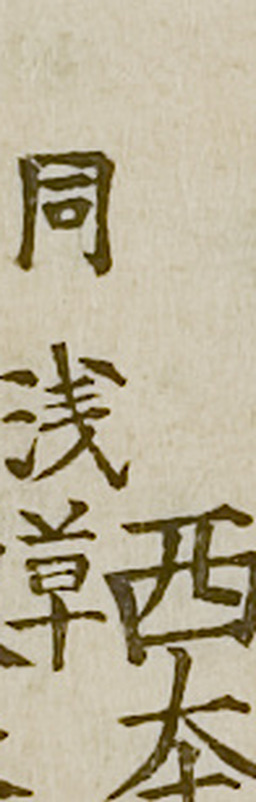同浅草
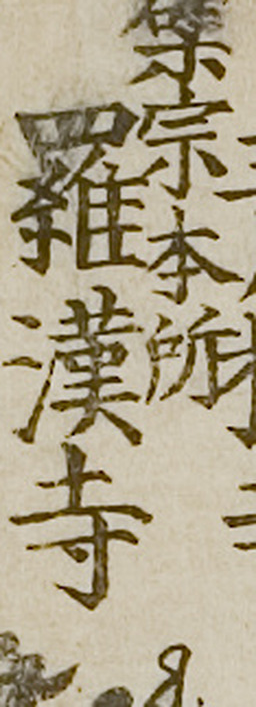羅漢寺
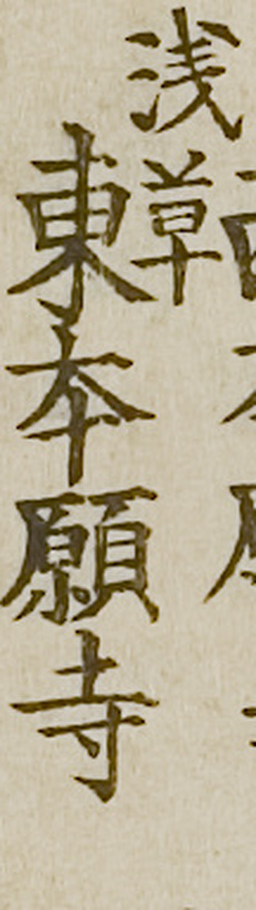東本願寺
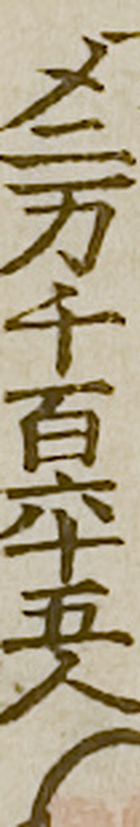〆二万千百六十五人
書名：[地震死者施餓鬼図]
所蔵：東京大学総合図書館 General Library in the University of Tokyo, JAPAN
